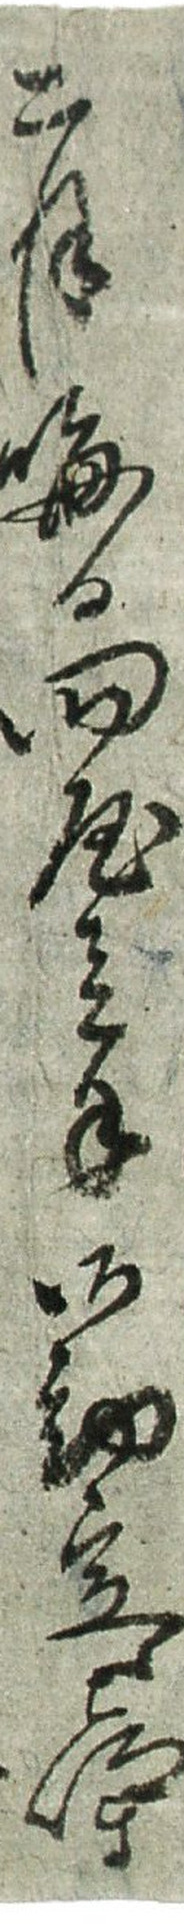二月晦日問屋壱手御勘定に被仰付
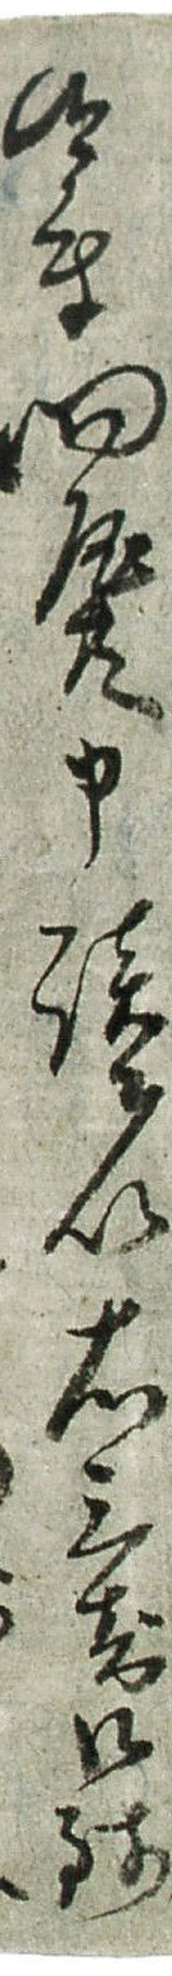候に付問屋共申談を以右三歩口銭
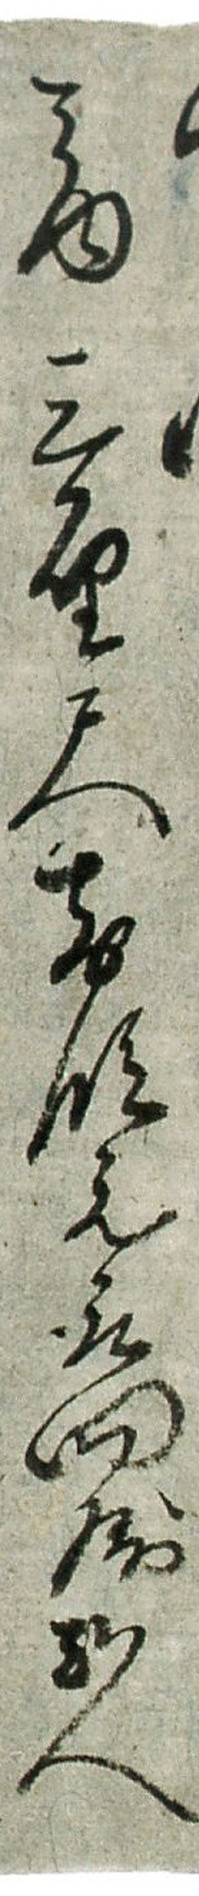之内三厘尺前段元取問屋弐人
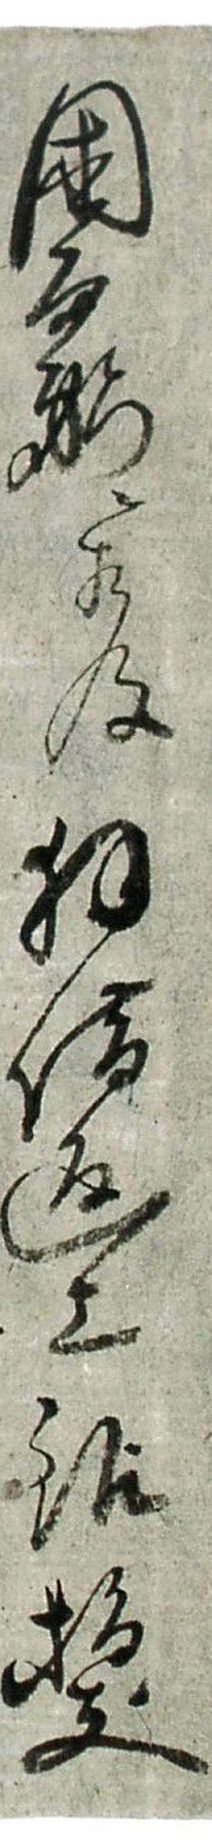困窮に相及拝借返上銀指支
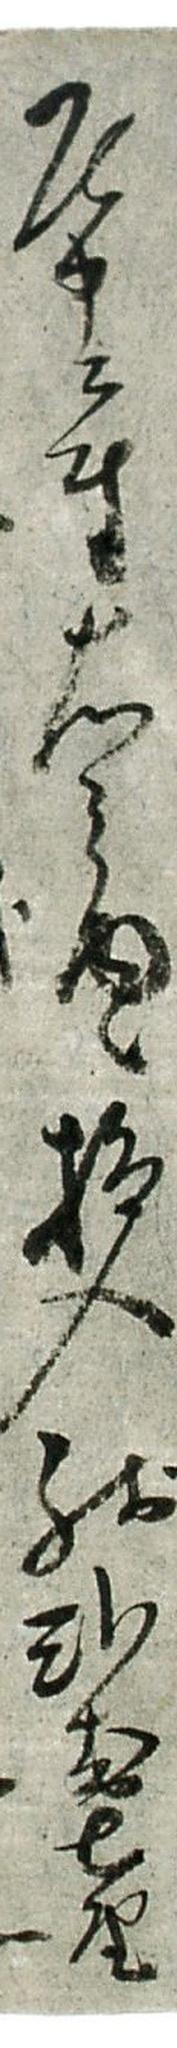居申に付右之内へ指入残弐歩七厘
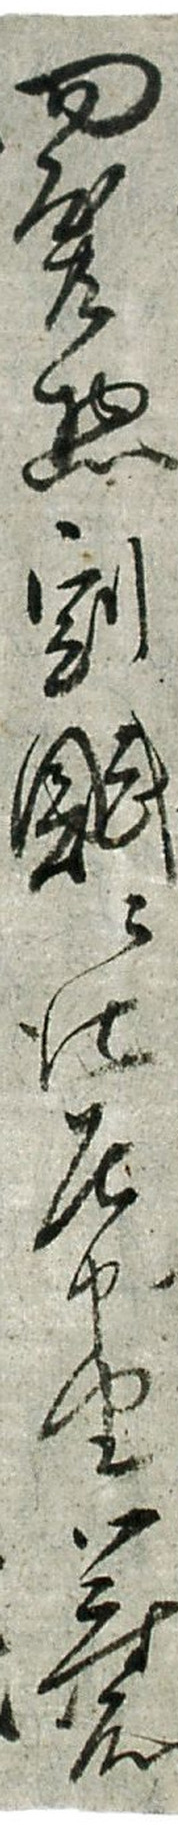問屋共惣割賦に仕居申由御座候所
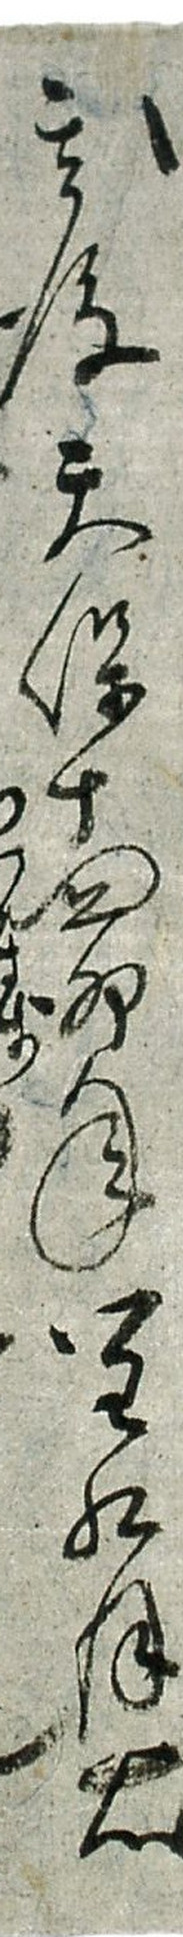其後天保十四卯年閏九月右
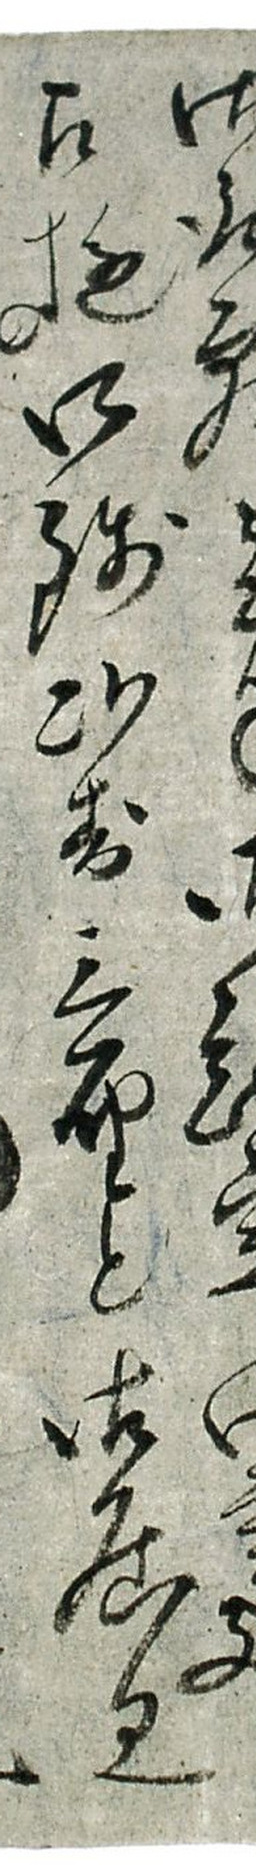被遊口銭弐歩三厘と御居見
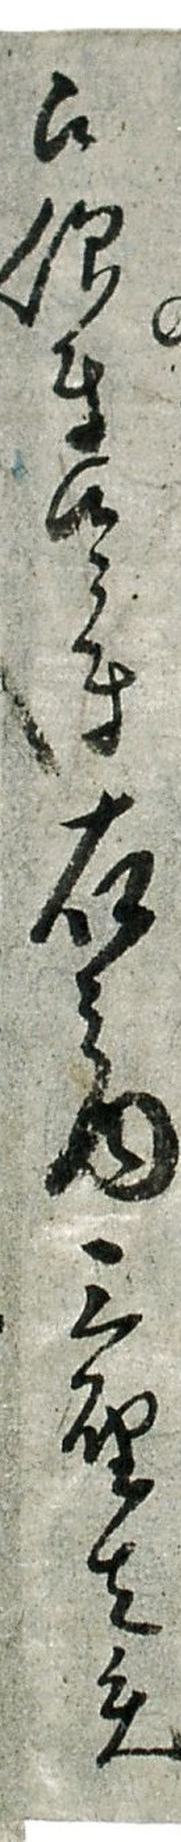被仰付候に付右之内三厘は矢
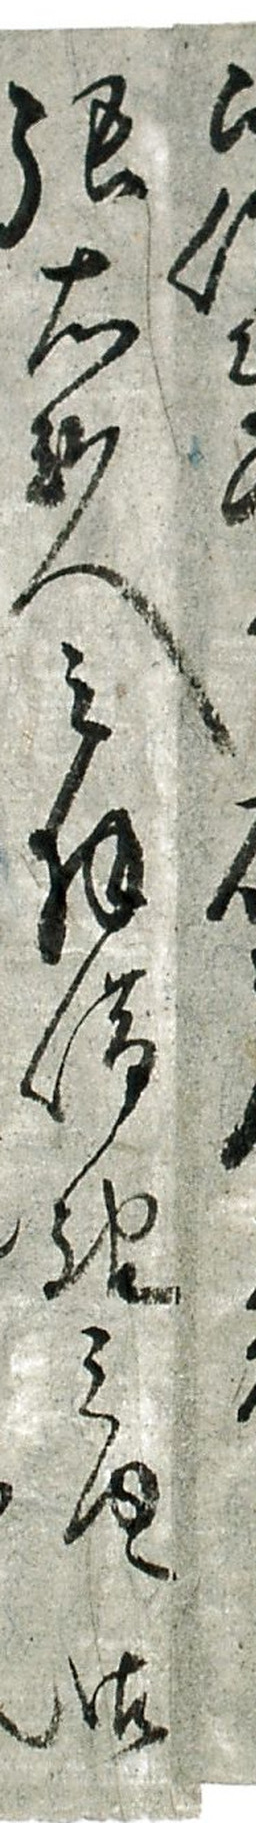張右弐人之拝借銀之内へ御
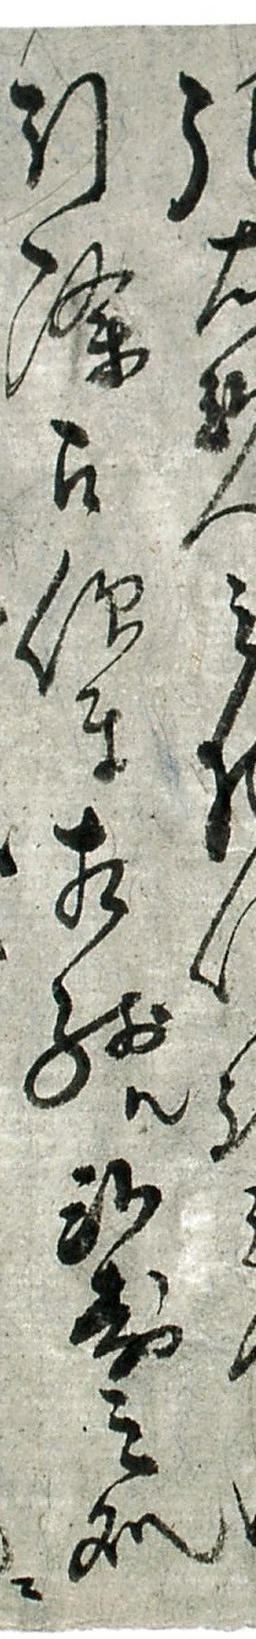引除被仰付相残る弐歩之処
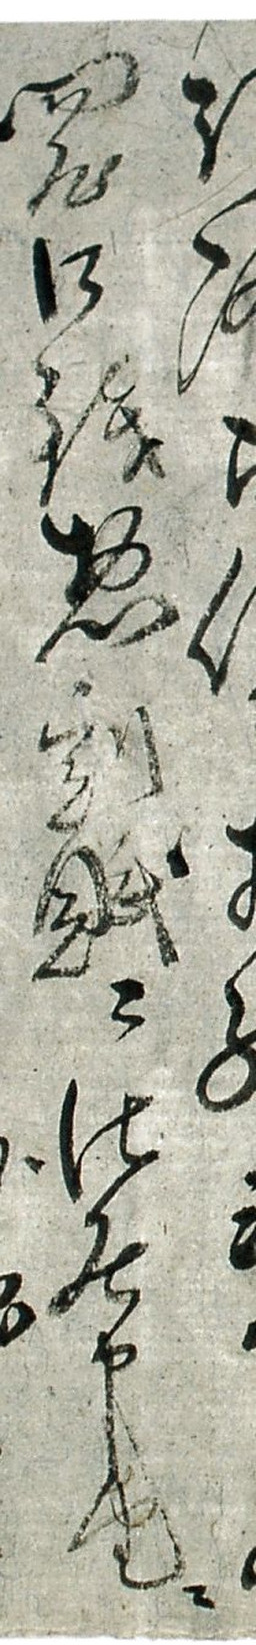問屋口銭惣割賦に仕居申候由に
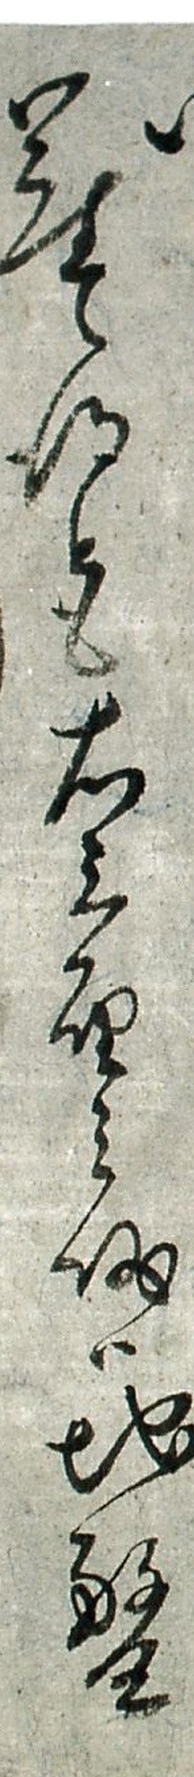御座候得とも右三厘之儀は地盤
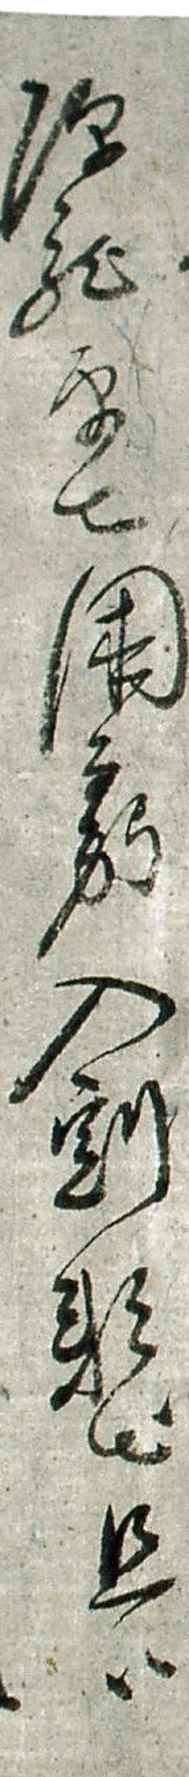源蔵平七困窮入割頼出且は
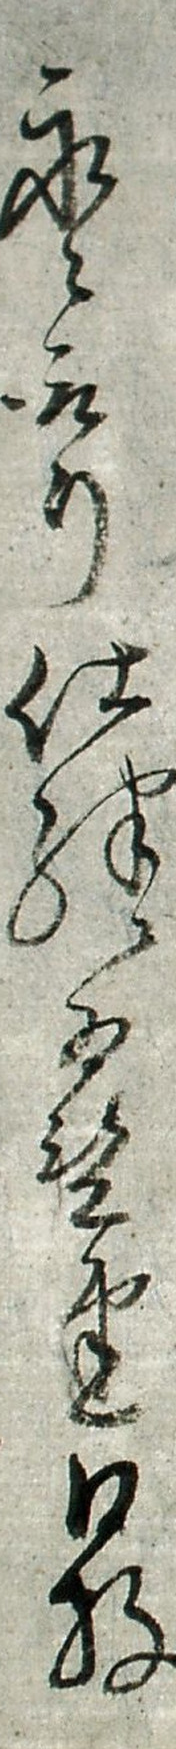永々取引仕殊に為替金日数
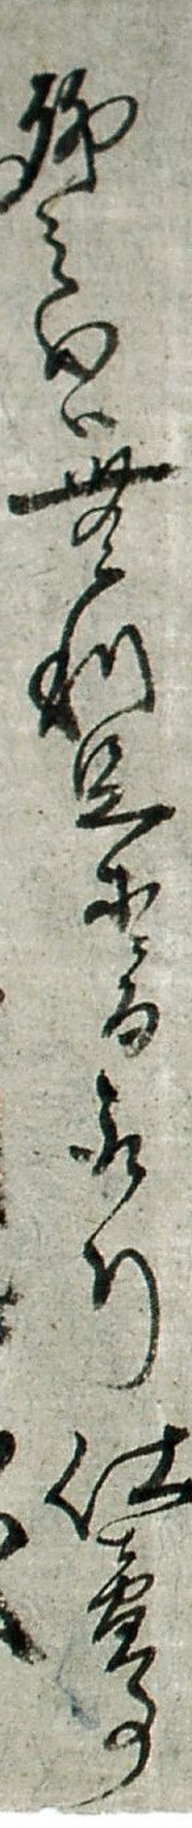聊之義は無利足等にて取引仕売事
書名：(美馬三好両郡百姓共煙草問屋壱手勘定ニ相成迷惑願右始末承申上書付之写）
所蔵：鳴門教育大学 Naruto University of Education
